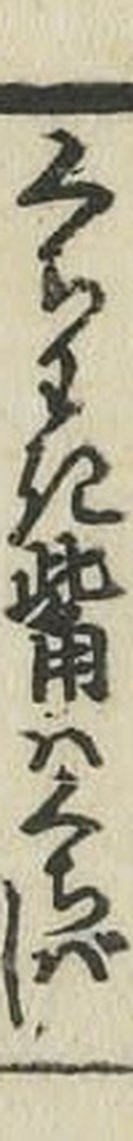くちわき觜はくちばし
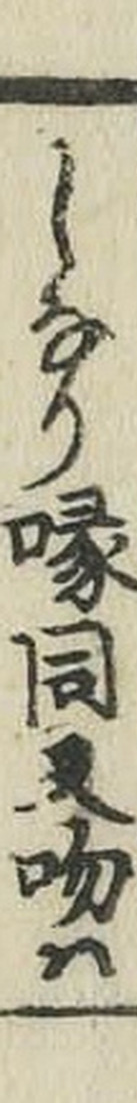しなり喙同又吻は
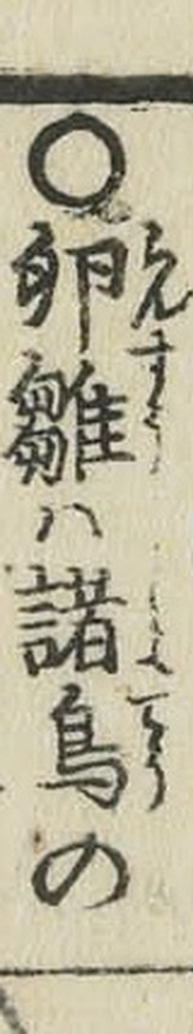○卵雛は諸鳥の
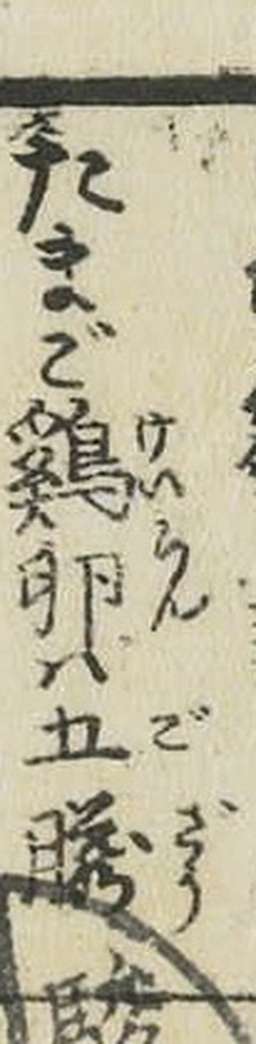たまご鶏卵は五臓
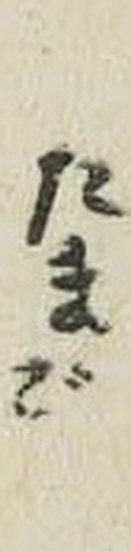たまご
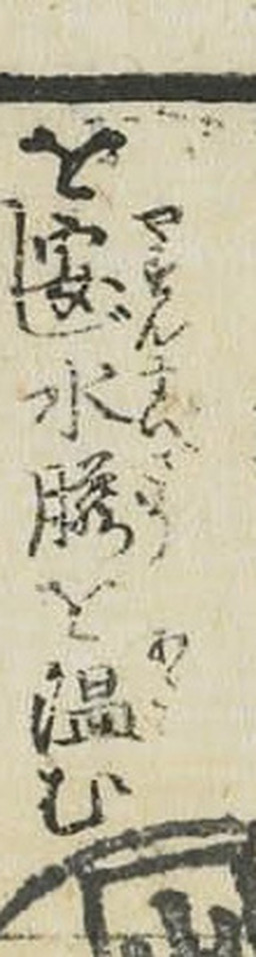を安じ水臓を温む
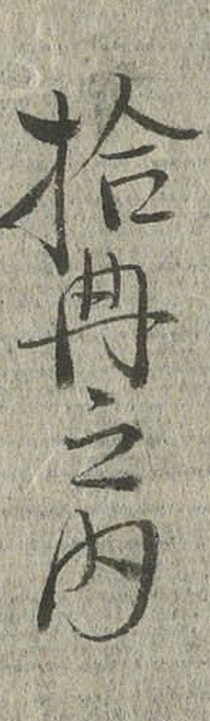拾冊之内
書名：増補頭書訓蒙図彙大成 10巻 6:巻之12-13
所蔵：東京学芸大学教育コンテンツアーカイブ
